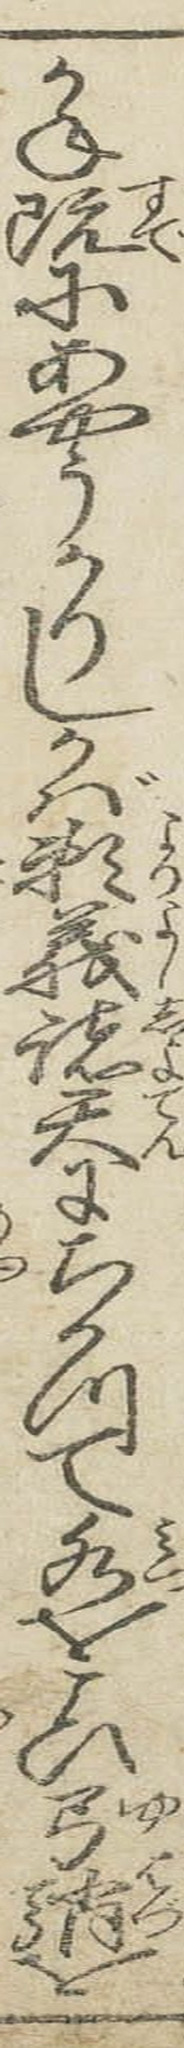かね既にあやうかりしかば頼義諸天にちかつて水をこひ弓弰を
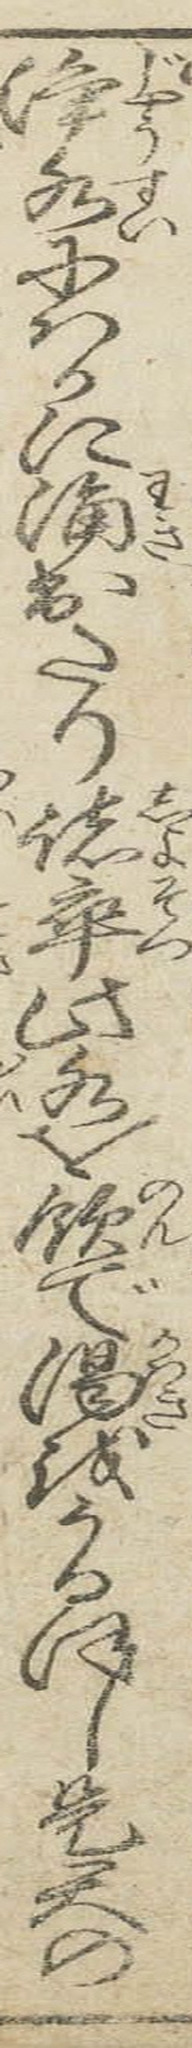浄水にはかに涌出たり諸卒此水を飲で渇をうるほし是天の
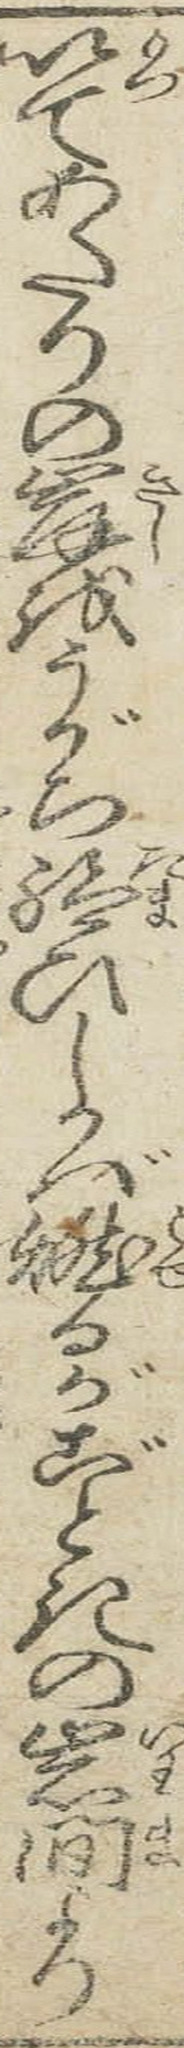以てあたりの岸をうがち給ひしかば燃るがごときの岩間より
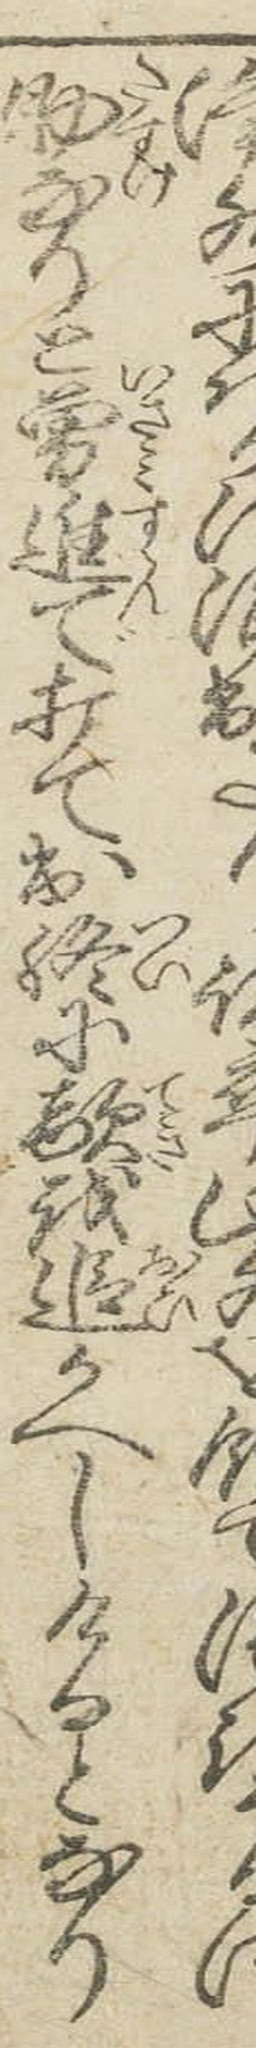助なりと勇進で打て出終に敵を追かへしけるとなり
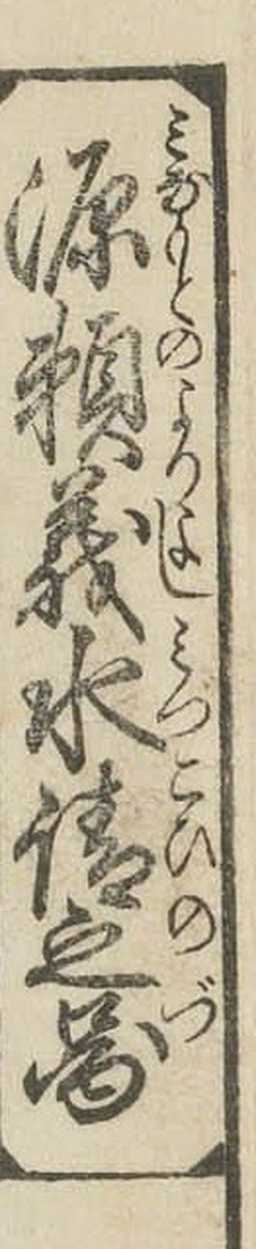源頼義水請之図
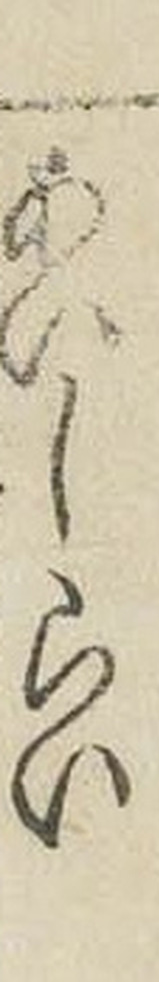あいしらい
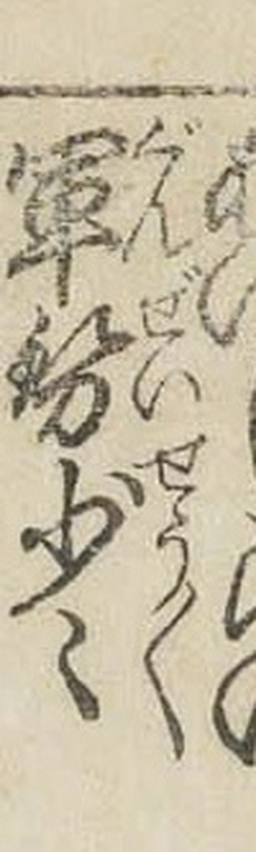軍勢少々
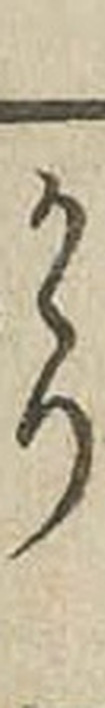かゝり
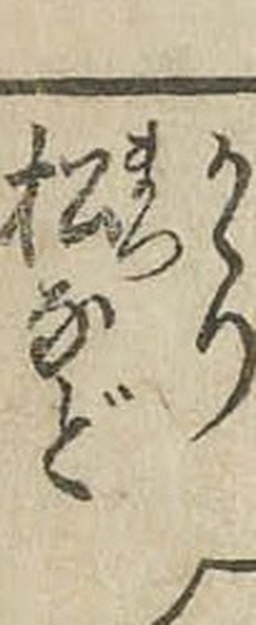松など
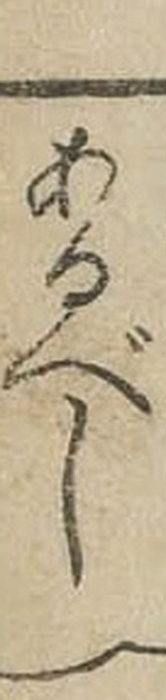あるべし

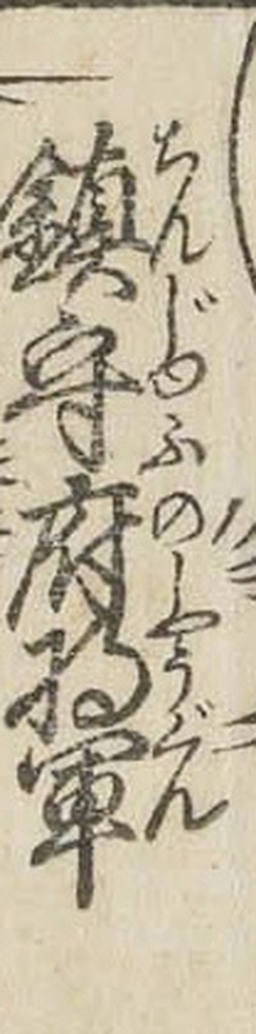鎮守府将軍
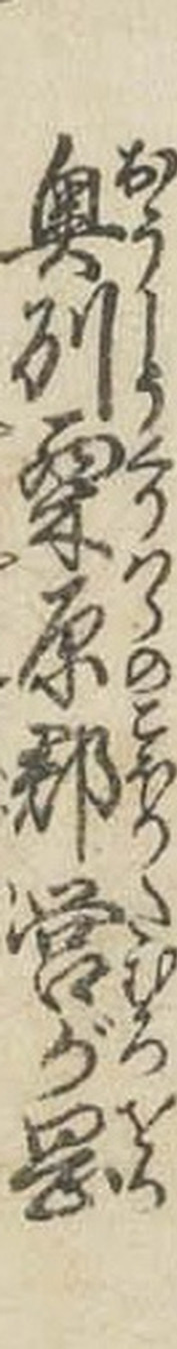奥州栗原郡営が岡
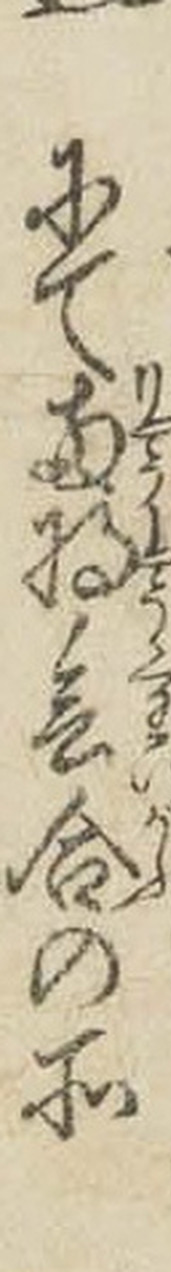にて両将会合の所
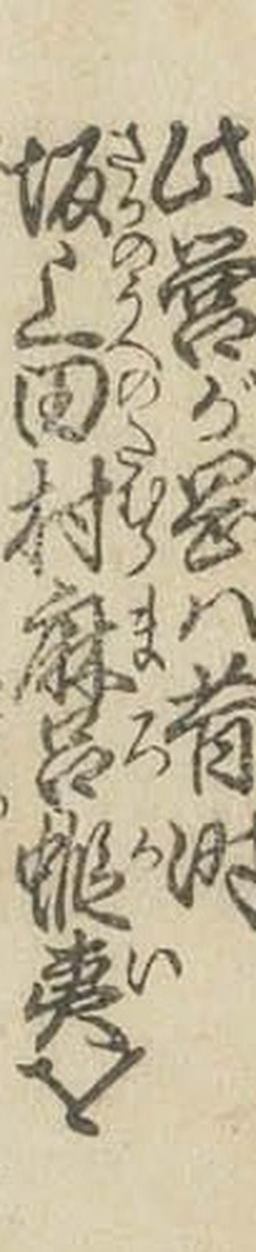坂上田村麻呂蝦夷を
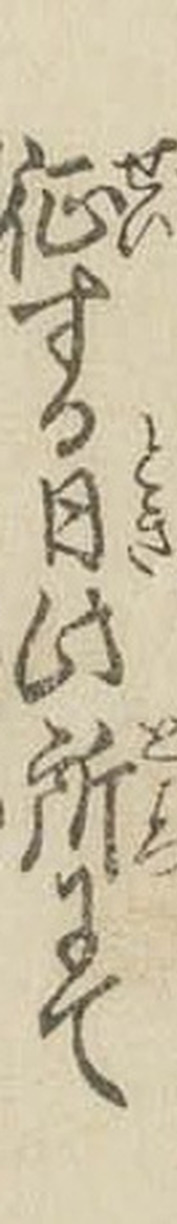征する日此所にて
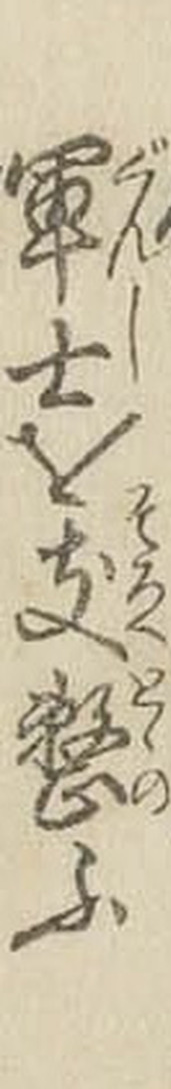軍士を支整ふ
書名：絵本写宝袋 9巻 2之巻
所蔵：東京学芸大学教育コンテンツアーカイブ
